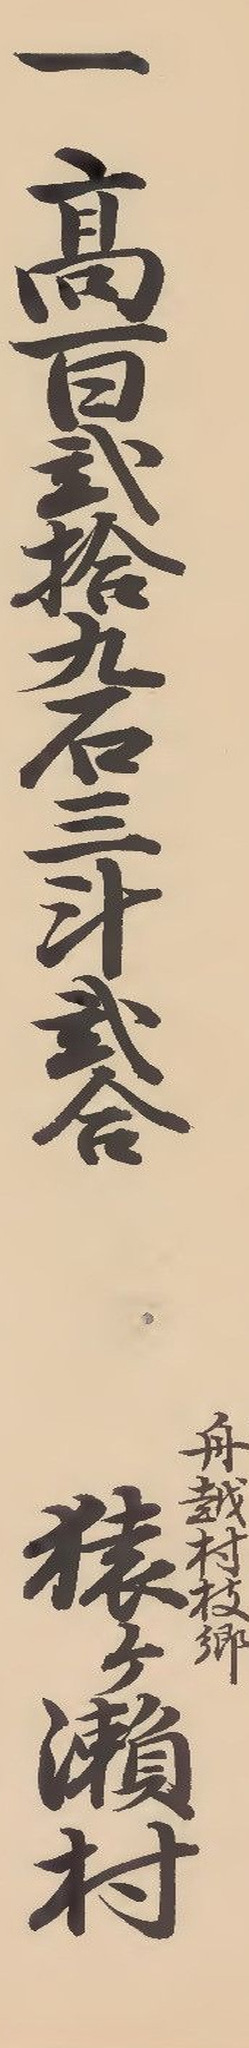一高百弐拾九石三斗弐合猿ヶ瀬村
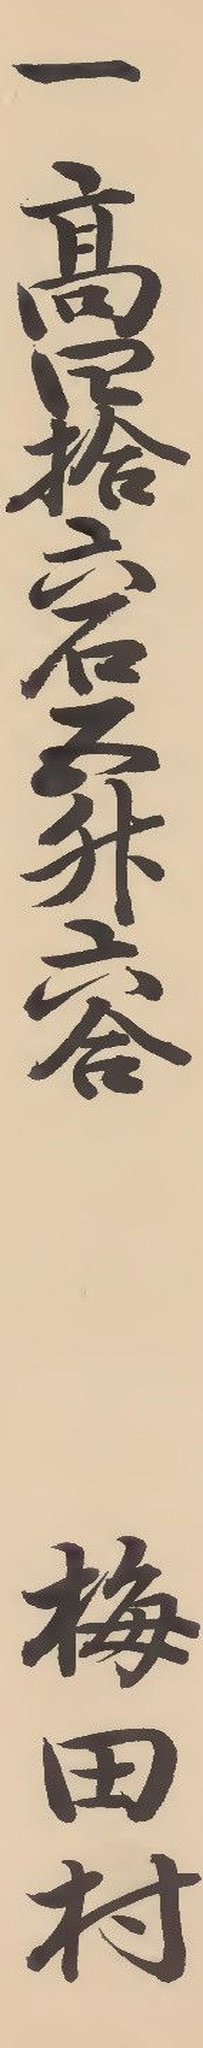一高四拾六石五升六合梅田村
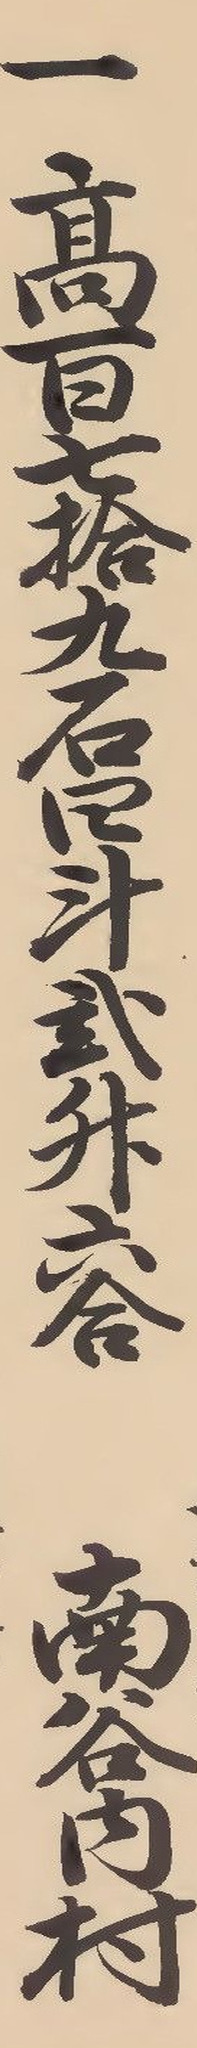一高百七拾九石四斗弐升六合南谷内村
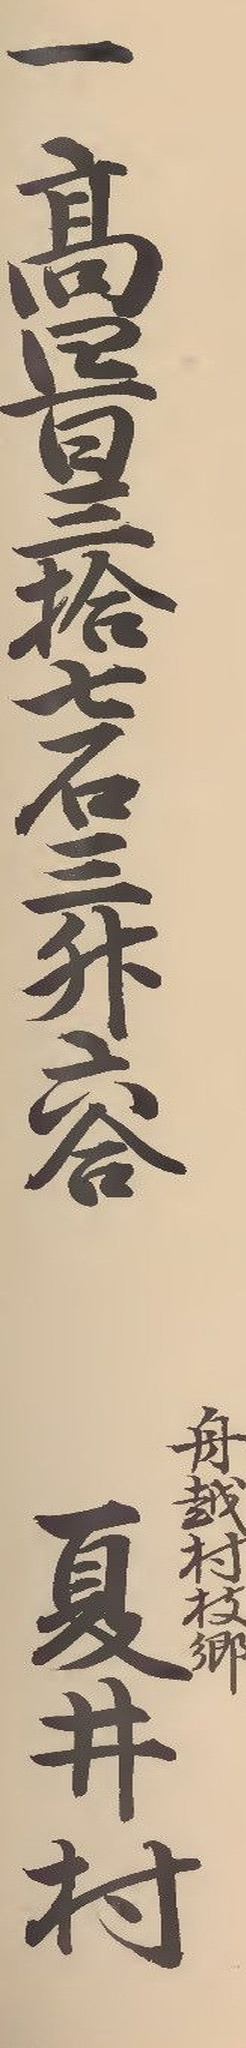一高四百三拾七石三升六合夏井村
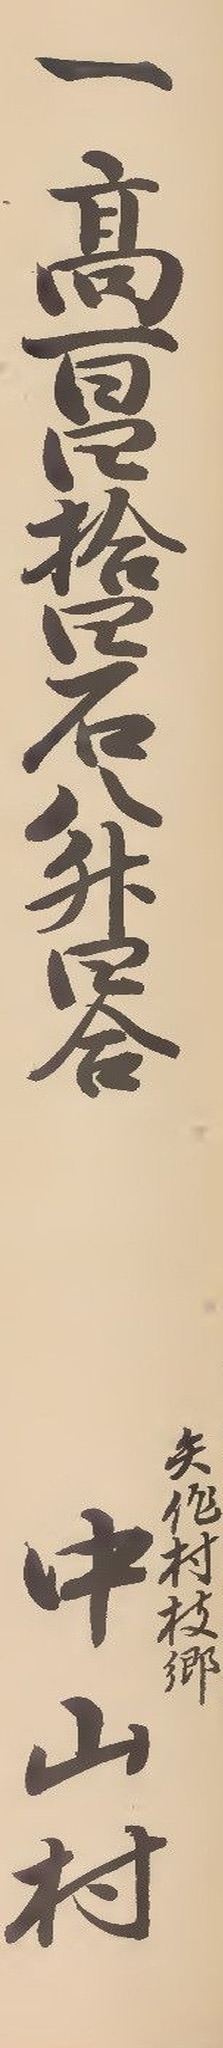一高百四拾四石八升四合中山村
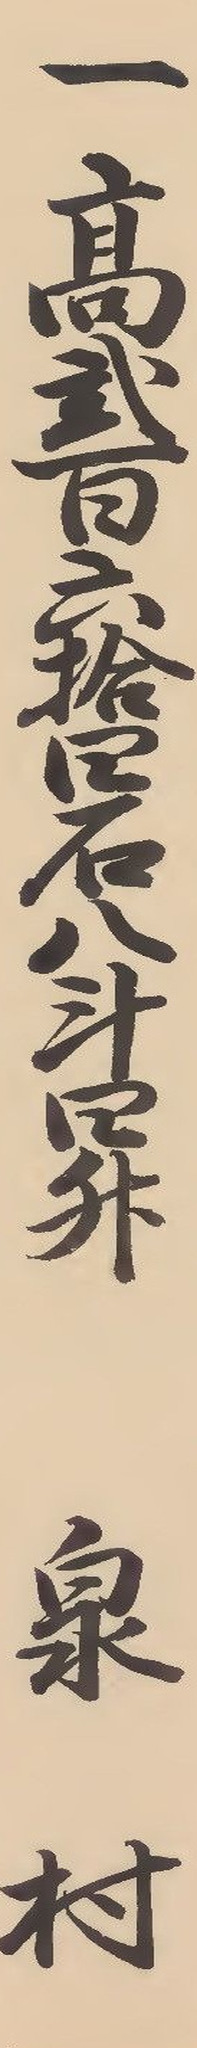一高弐百六拾四石八斗四升泉村
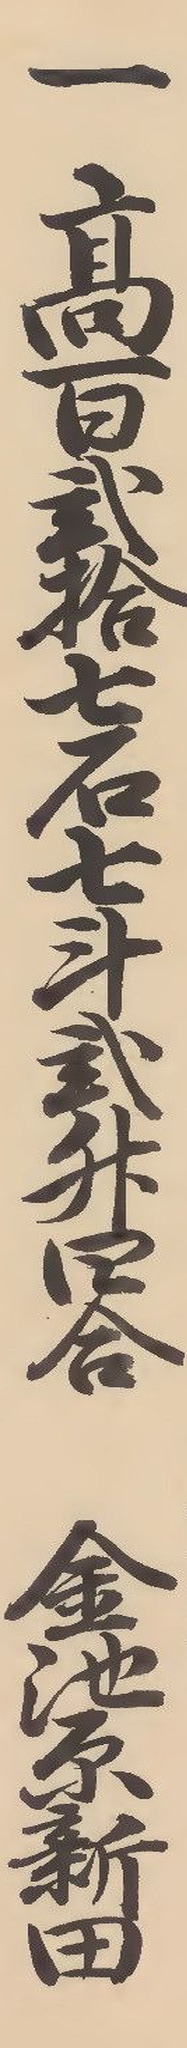一高百弐拾七石七斗弐升四合金池原新田
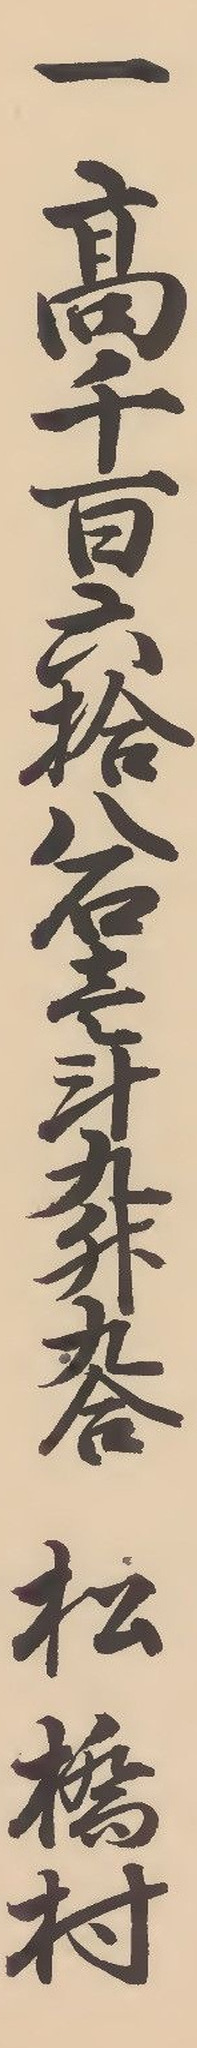一高千百六拾八石壱斗九升九合松橋村

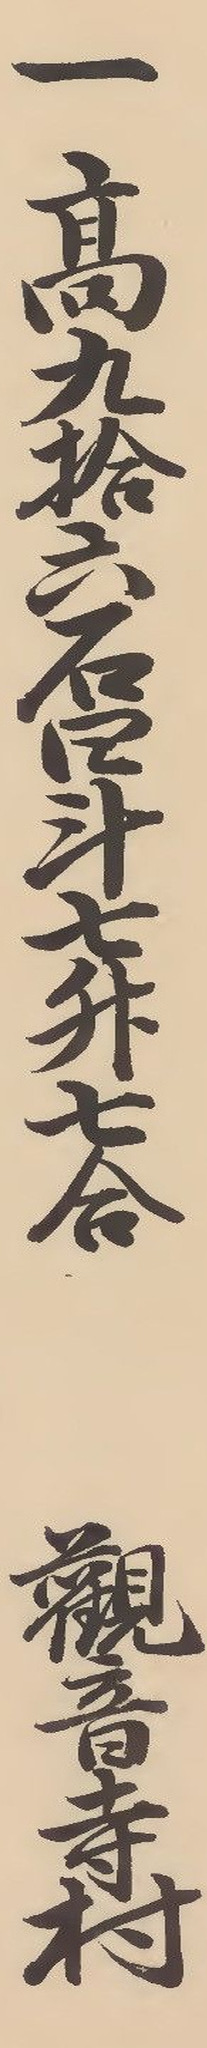一高九拾六石四斗七升七合観音寺村
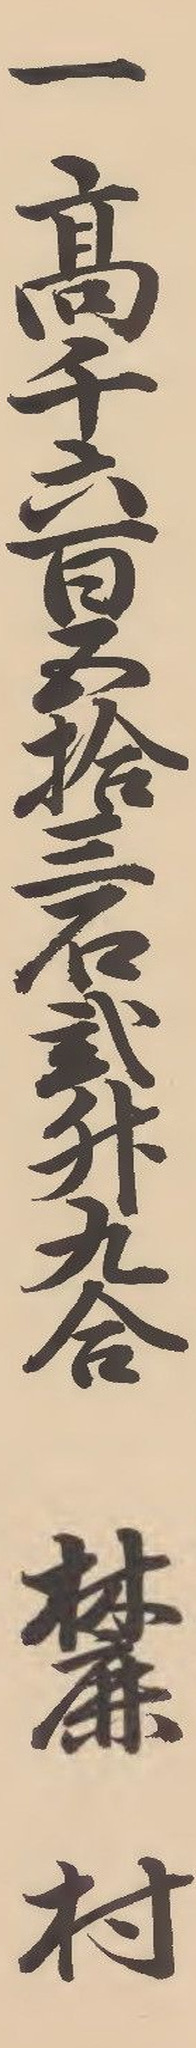一高千六百五拾三石弐升九合麓村
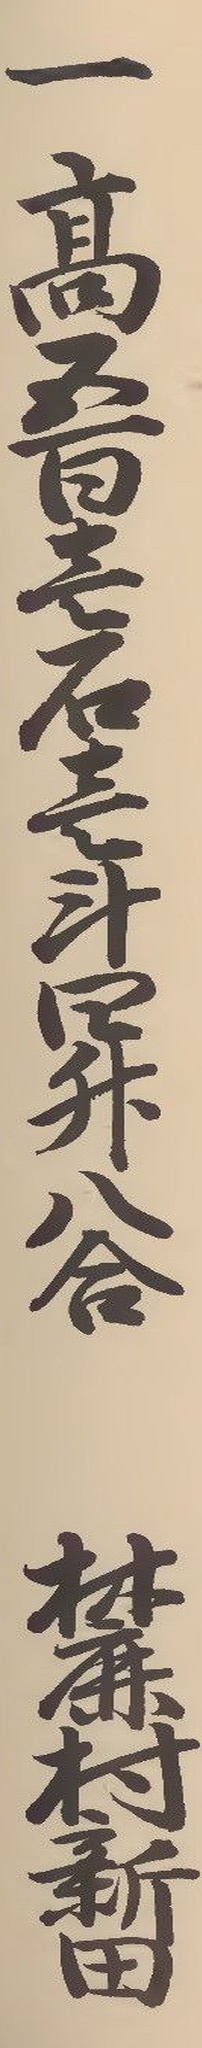一高五百壱石壱斗四升八合麓村新田
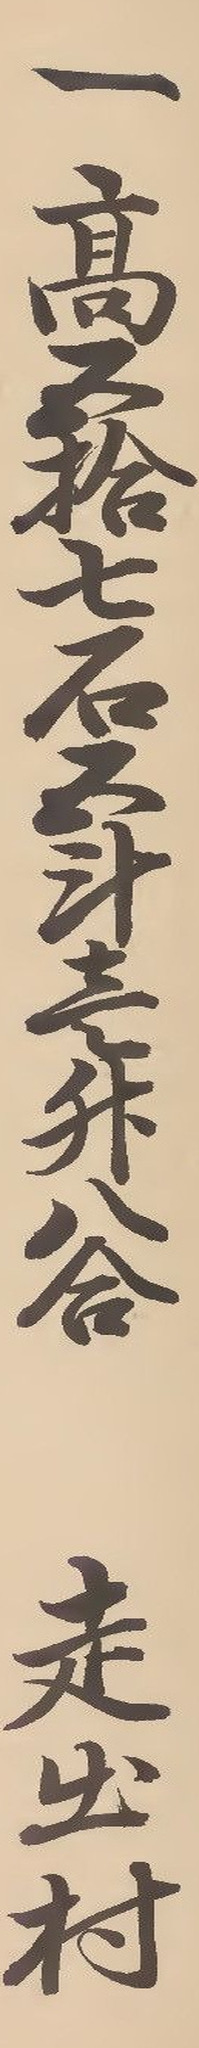一高五拾七石五斗壱升八合走出村
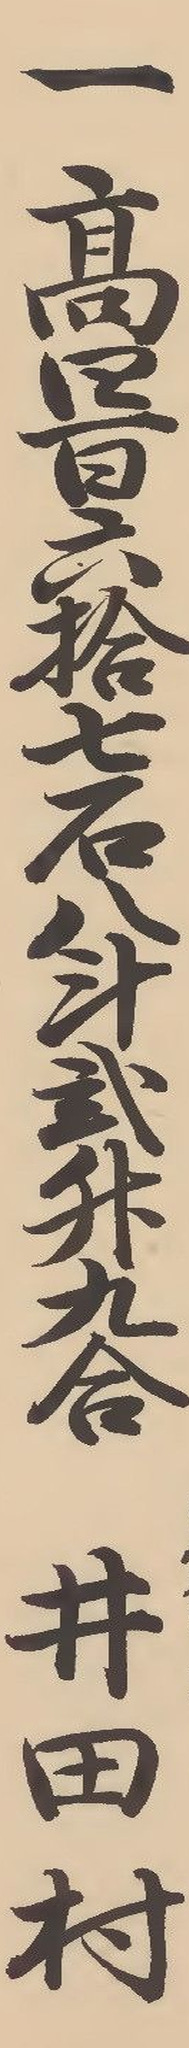一高四百六拾七石八斗弐升九合井田村
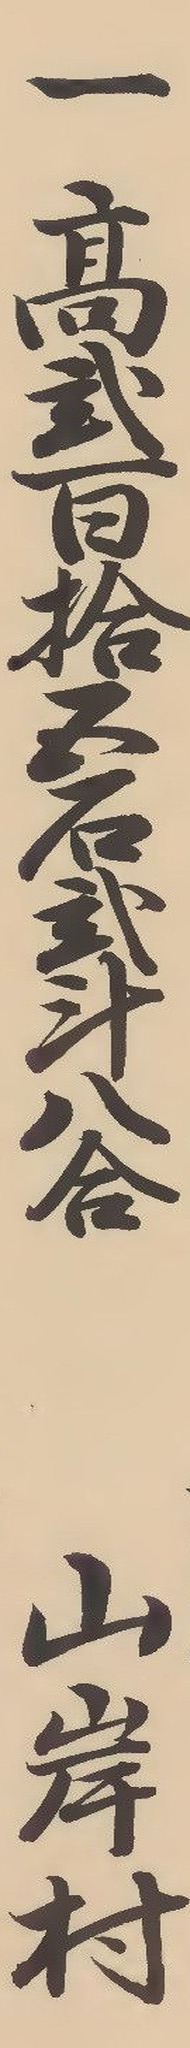一高弐百拾五石弐斗八合山岸村
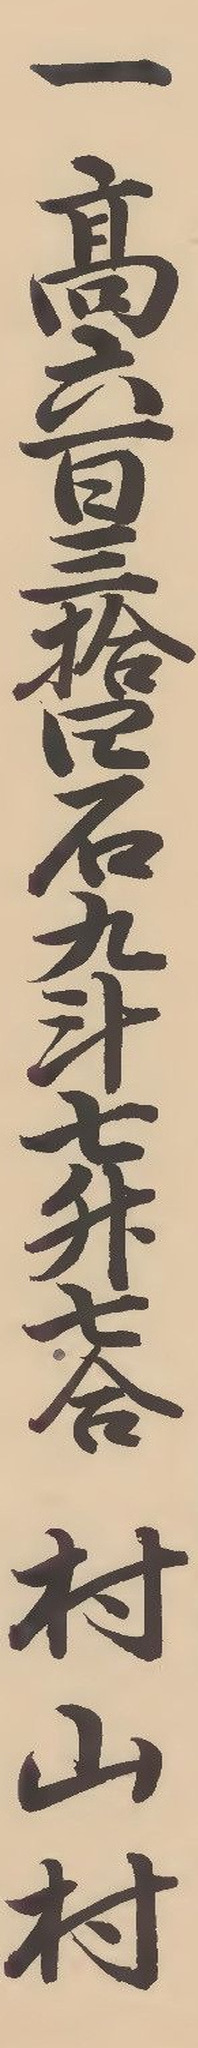一高六百三拾四石九斗七升七合村山村

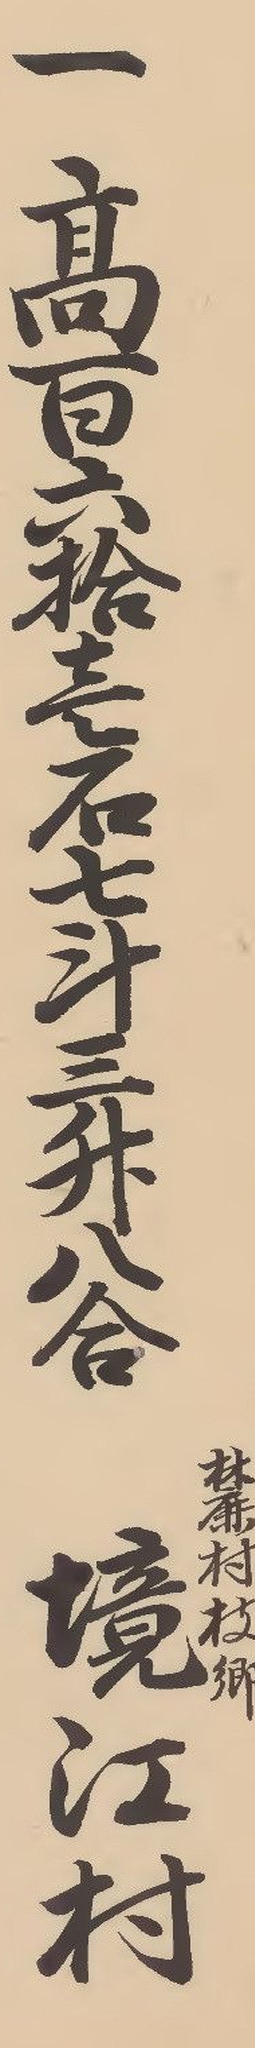一高百六拾壱石七斗三升八合境江村
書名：越後国郷帳　下
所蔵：国立公文書館 National Archives of Japan
